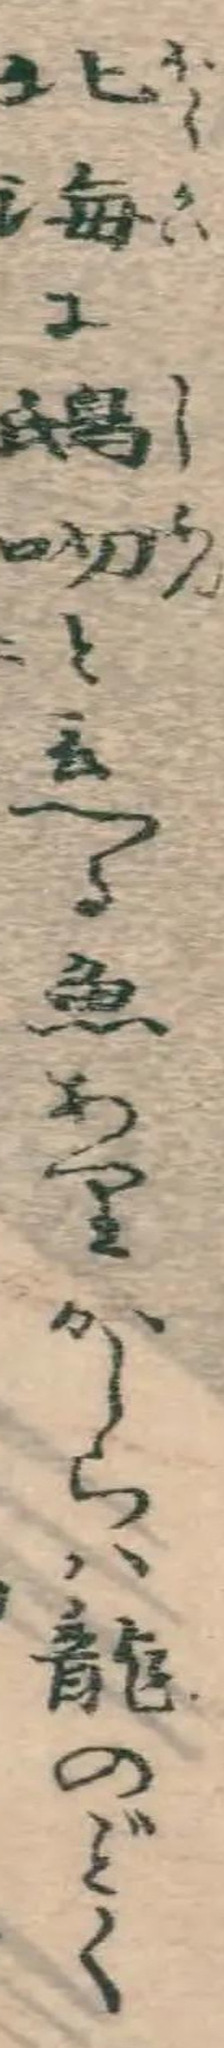北海の鴟吻と言へる魚ありかしらは龍のごとく
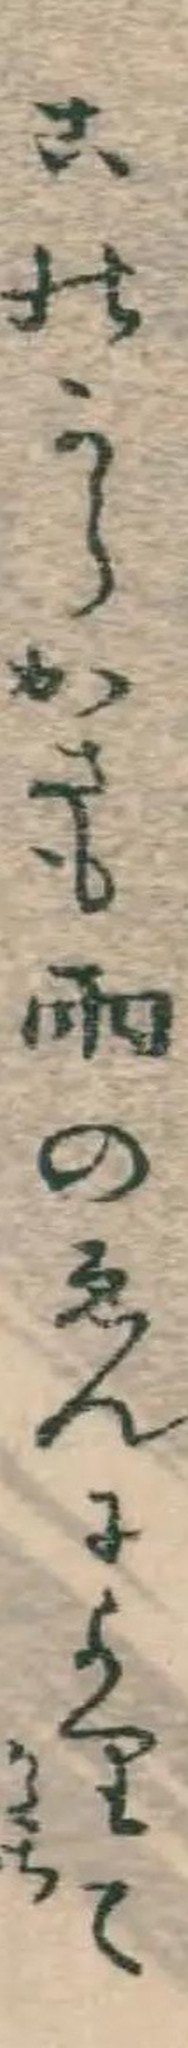このからかさも雨のゑんによりて
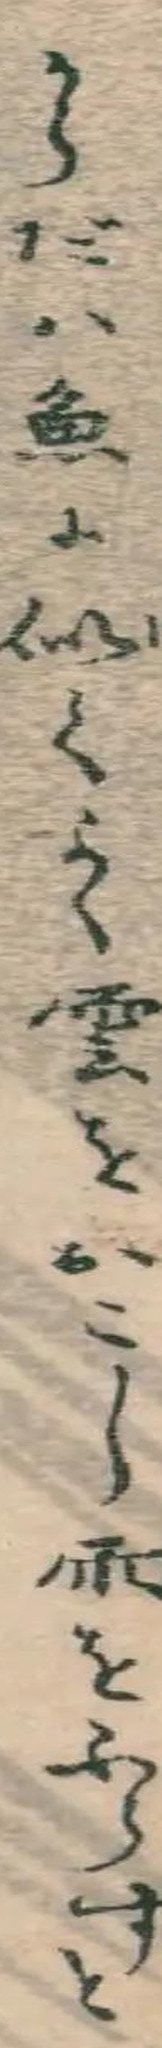からだは魚に似てよく雲をおこし雨をふらすと
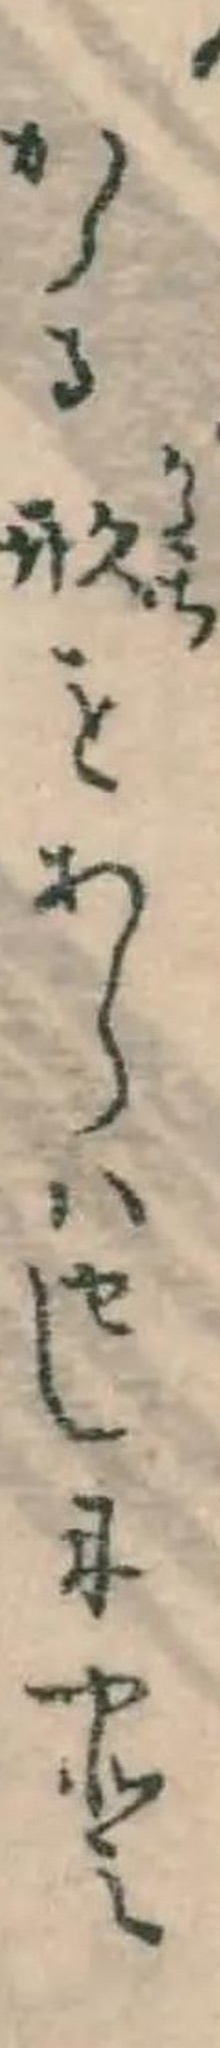かゝる形をあらはせしにやと
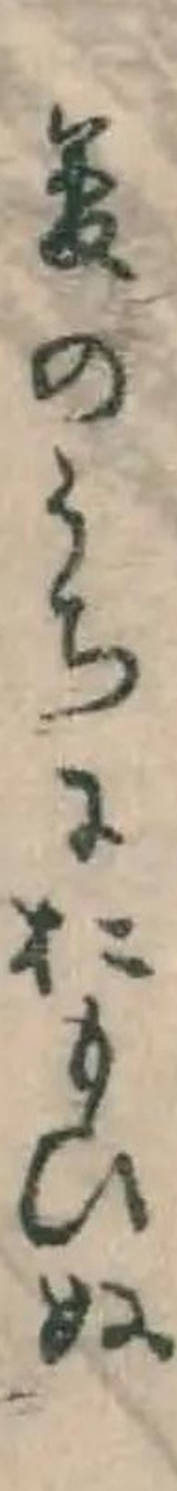夢のうちにおもひぬ

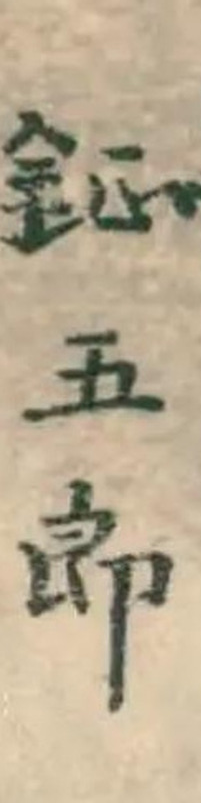鉦五郎
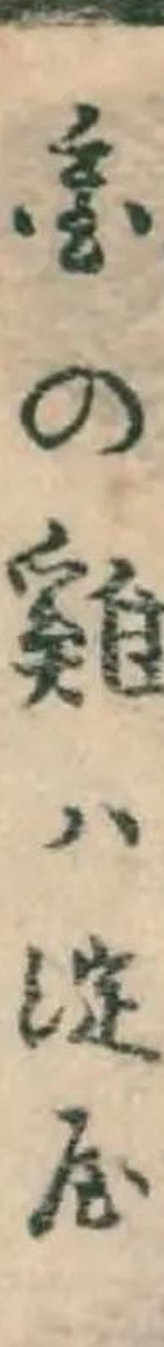金の鶏は淀屋
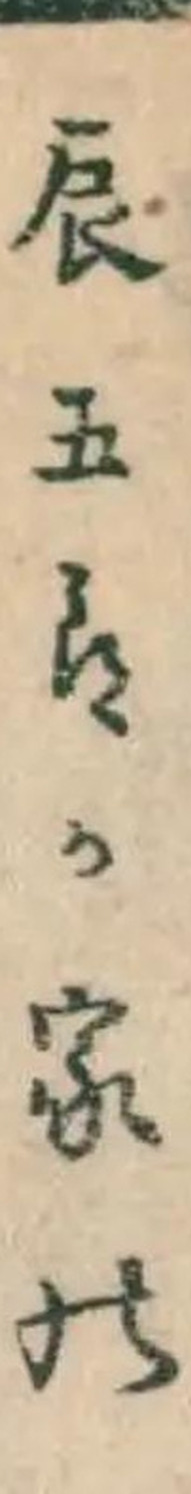辰五郎か家の
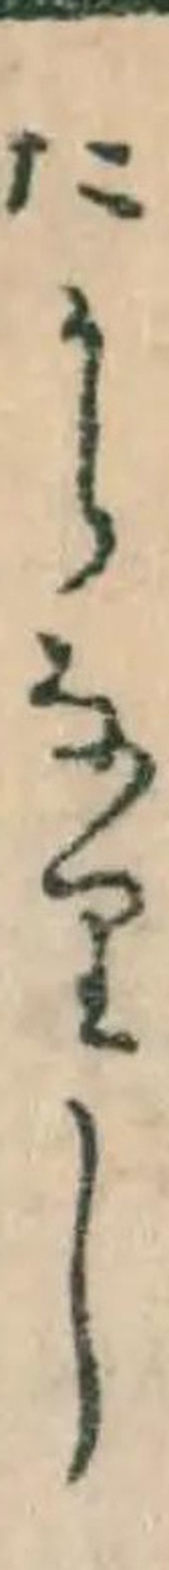たからなりし
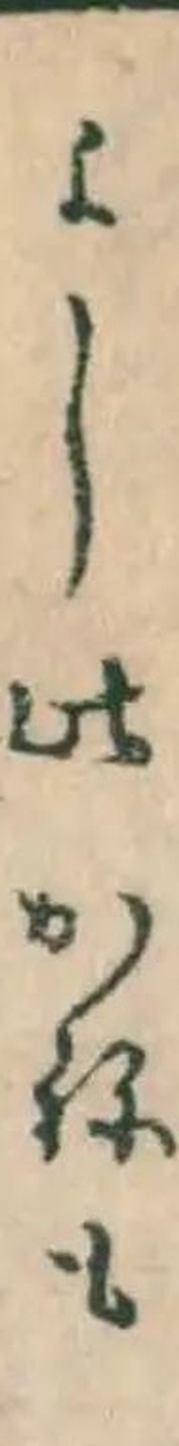よし此かねも
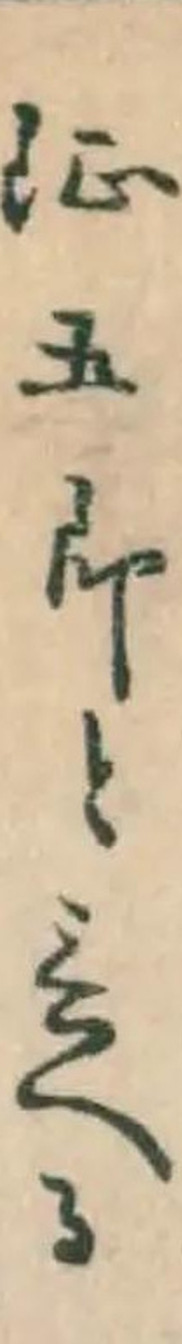鉦五郎と言へる
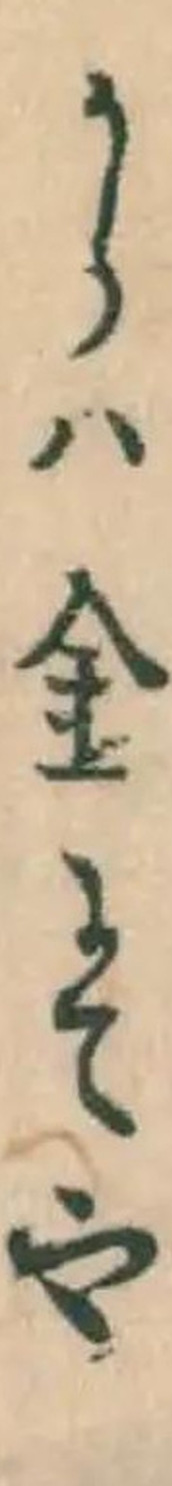からは金にてや
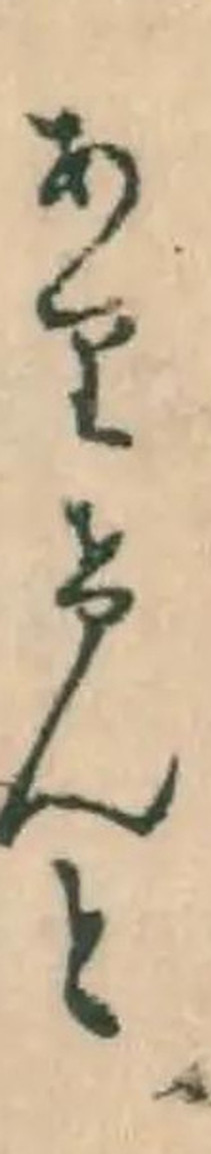ありけんと
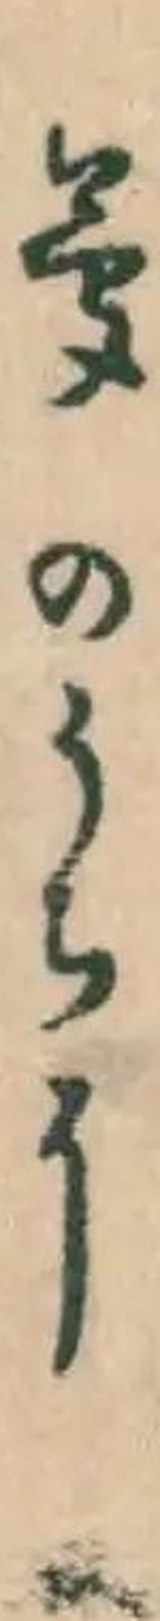夢のうちに
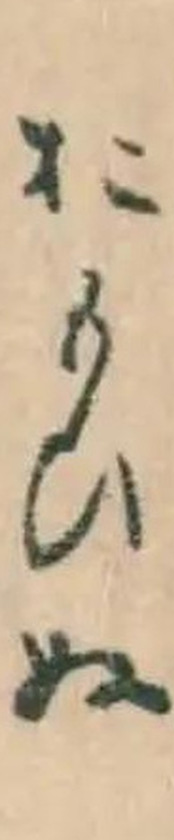おもひぬ
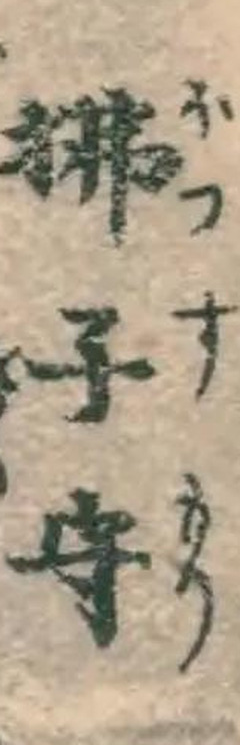拂子守
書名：百鬼徒然袋 3巻. [1]
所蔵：国立国会図書館 National Diet Library, JAPAN
